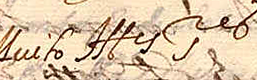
Muito Il̄les sres
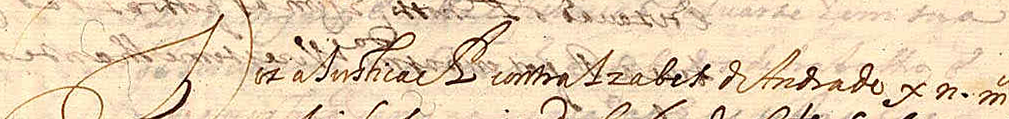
Diz a Iustica A contra Izabel de Andrade x n mer
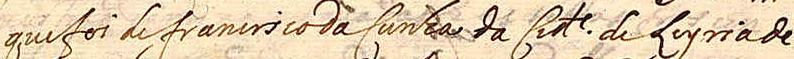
que foi de francisco da Cunha da cid̄e. de Leyria de
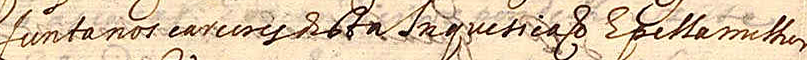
funta nos cerceres esta Inquisicaõ E pella melhor
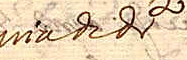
uia de drto
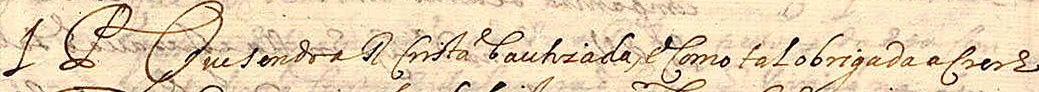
1 P Que sendo a R Cristā bautizada, & Como tal obrigada a Crer E
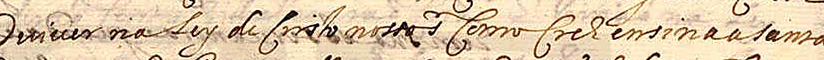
uiuer na Ley de Cristo nosso sr Como Cre E ensina a santa
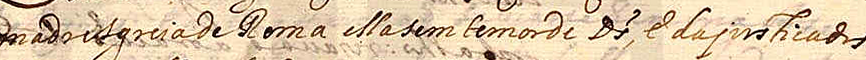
madre Igreia de Roma ella sem temor de Ds̄, & da justica des
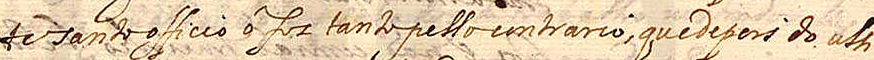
te santo officio o fez tanto pello contrario, que depois do ulti
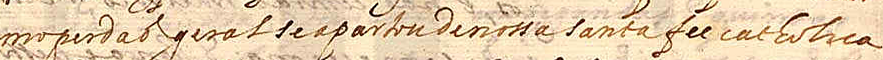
mo perdaõ geral se apartou de nossa santa fee catholica
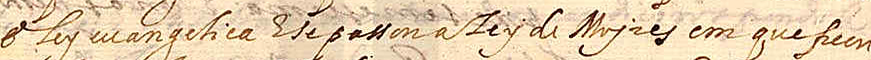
& Ley euangelica E se passou a Ley de Mojzes em que ficou
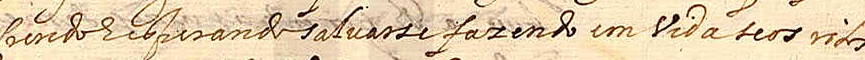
Crendo E esperando saluarse fazendo em Vida seos ritos
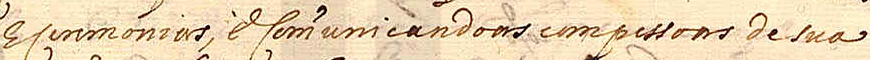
E Cerimonias, & Com̄unicandoas com pessoas de sua
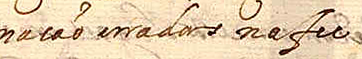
nacaõ erradas na fee
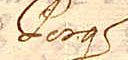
Porq̄
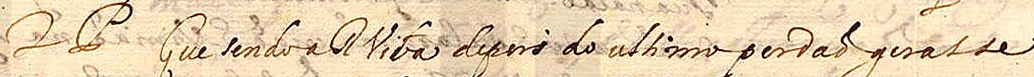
2 P Que sendo a R Viva depois do ultimo perdaõ geral se
